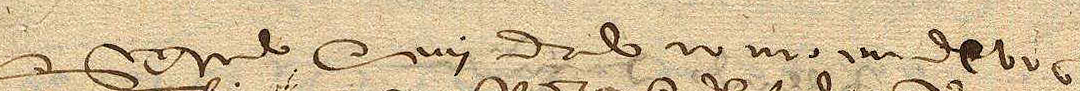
e segredo e cuydado como eu de vos
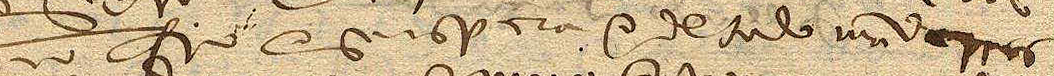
c̄ofjo e se espera e de tudo mādarres
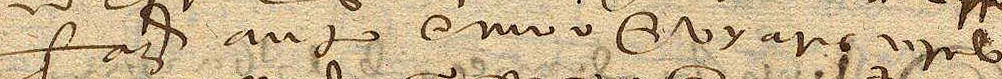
faz̄ auto e moo ēvyares cerado
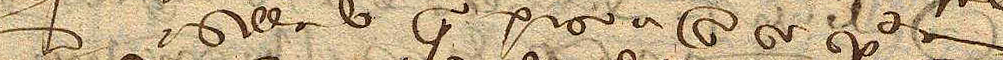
e asellado p̄o pesoa sē sospta
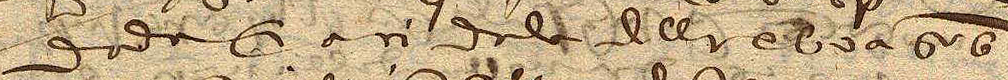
dada ē a cidade de llixboa sob
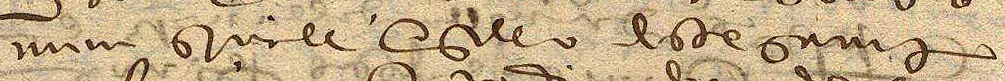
meu sjnall e sello deste samto
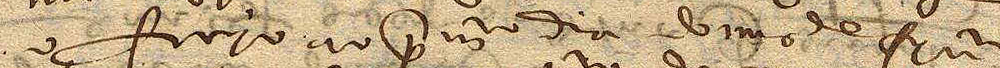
oficyo ao p̄imro dia do mes de fyuro
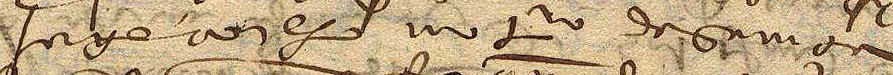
Jorge coelho notro da samta
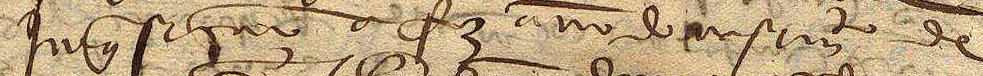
Jmq̄sição a fez āno do nasimto de
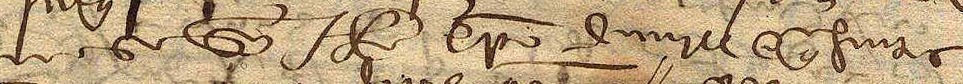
noso s̄or Jhū xp̄o de mjll e q̄nhentos
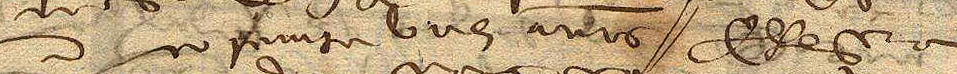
e coremta dous anos // E lhe sera
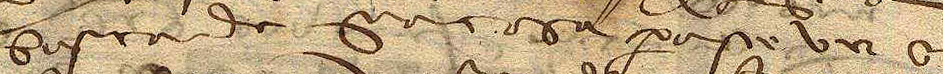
buscada sua casa ꝑa see ver se
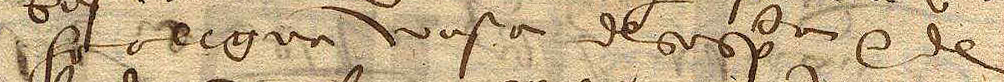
ha allguā cousa de sospta e de
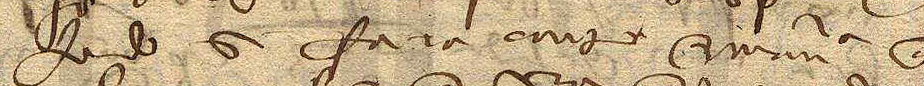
tudo se fara auto ē manra q̄
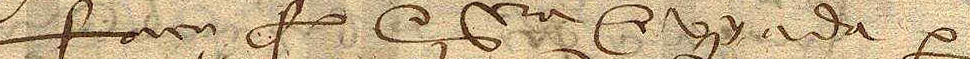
faça fꝭ e sera ēvyada ꝑ
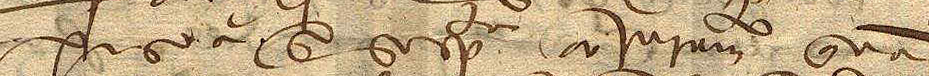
pesoa sē sospta c̄o Juramto q̄ nā
